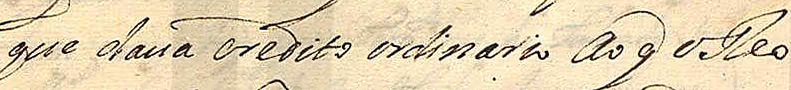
que daua credito ordinario ao q̄ o Reo
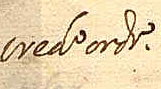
credo ordro.
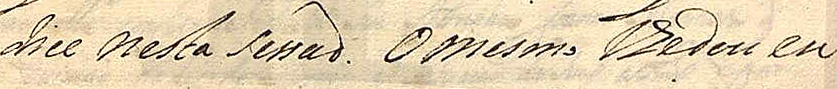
dice nesta sessão. O mesmo lhe dou eu
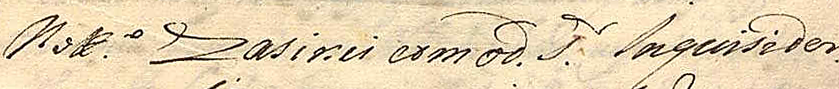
Nott.o E asinei com o d̄. s.or Inquisidor
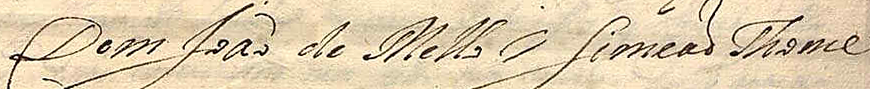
Dom João de Mello = Simeão Thome
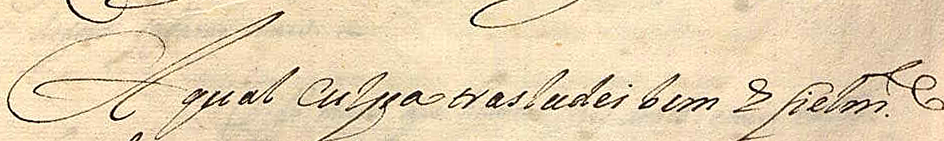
A qual culpa trasladei bem E fielm.te
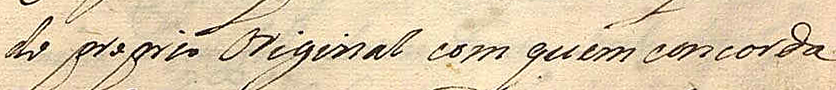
do proprio Original com quem concorda
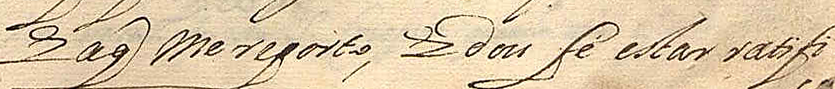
E a q̄ me reporto, E dou fé estar ratifi
